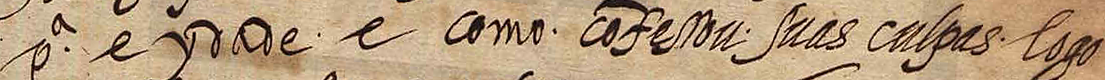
p.a e ydade e como cōfessou suas culpas logo
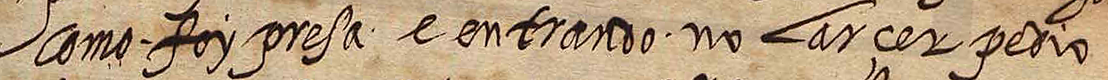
como foy presa e entrando no Carcer pedio
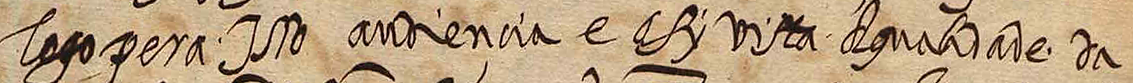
logo pera Jsso audiencia e asy vista A qualidade da
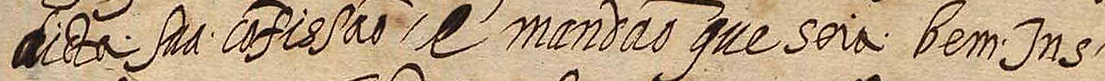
dicta sua cōfissão / e mandão que seia bem Ins
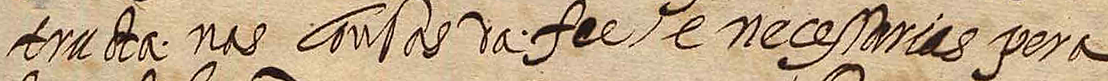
tructa nas cousas da fee / e necessarias pera
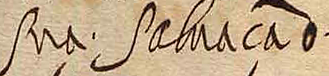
sua saluação
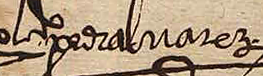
Ldo pedraluarez
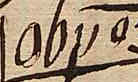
o bp̄o
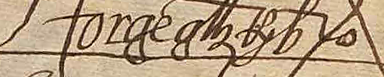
Jorge ḡllz Rybro
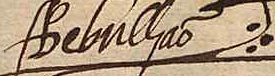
bulhaõ
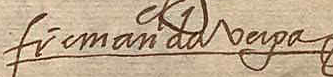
fr̄ emanuel da veiga
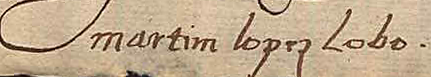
martim lopez Lobo
